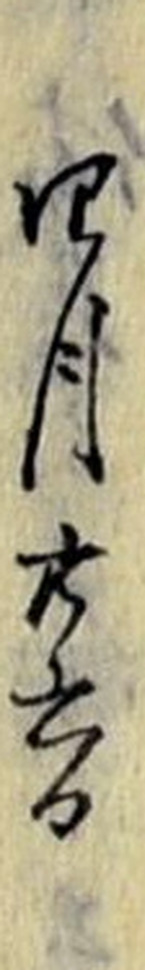四月廿六日
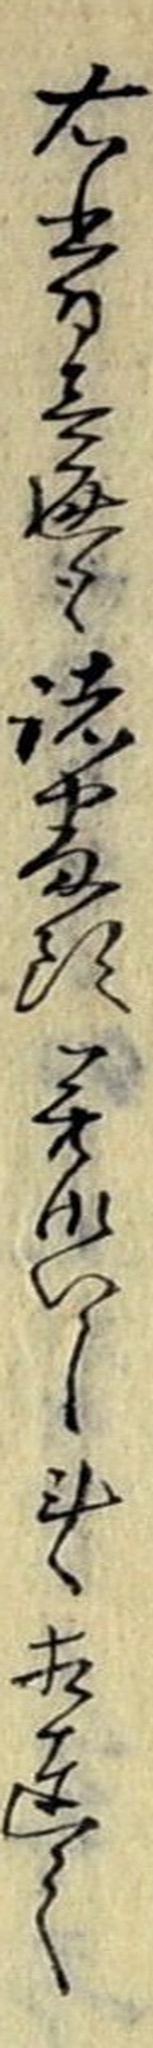右書付壱通つヽ諸番頭へ并御いし斗へ相達之
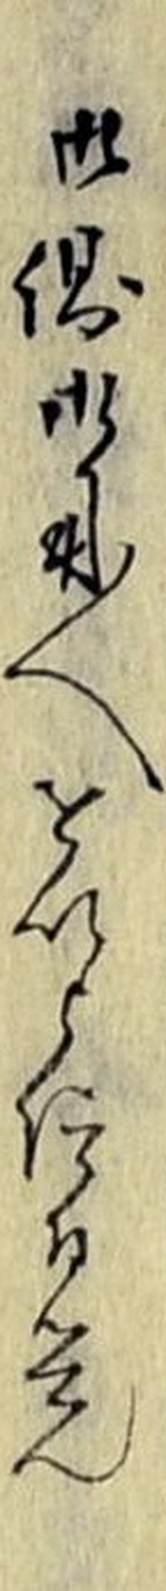御側御用人を以被仰付覚
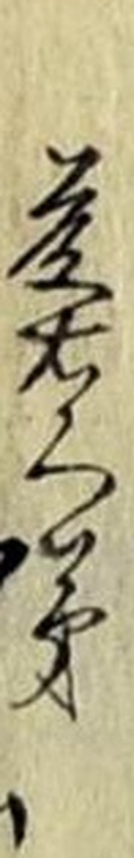藤右衛門弟
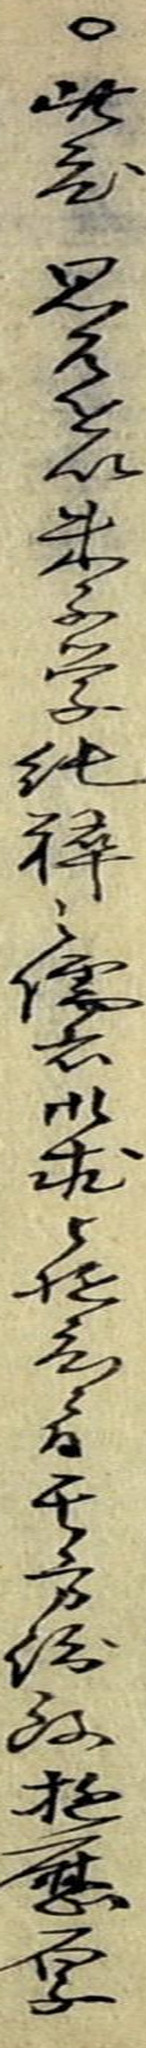○此度思召を以朱子学純粋之儒者御求被遊度に付其方儀致遊歴厚
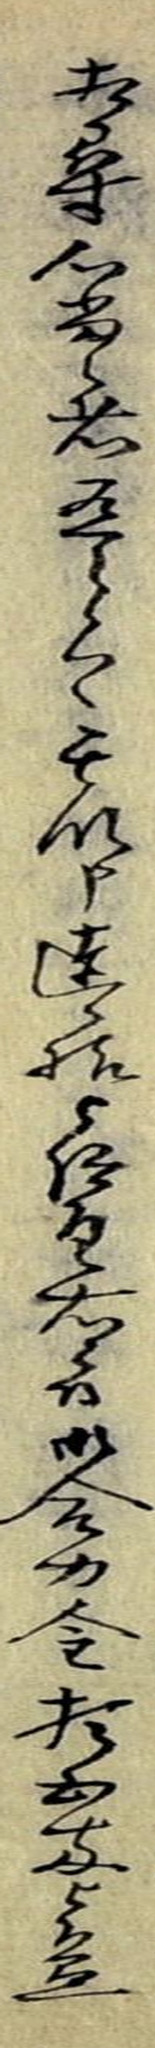相尋心当之者有之候はヽ其段申達候様被仰付候右に付御合力金拾五両被下置
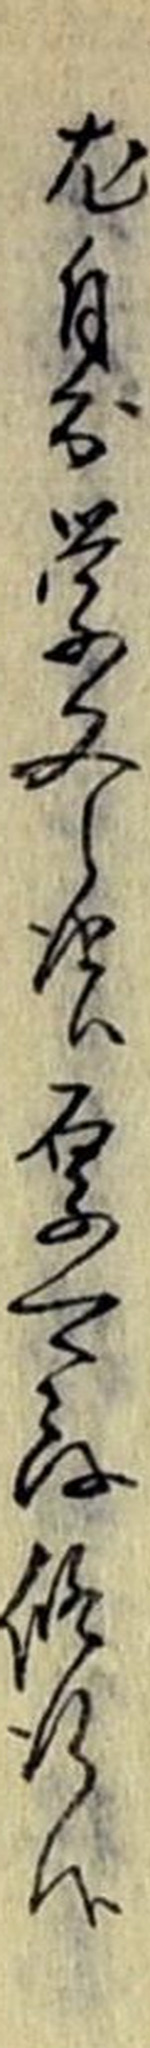尤自分学問之儀は厚可致修行候
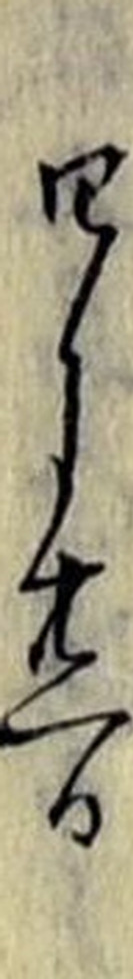四月廿一日
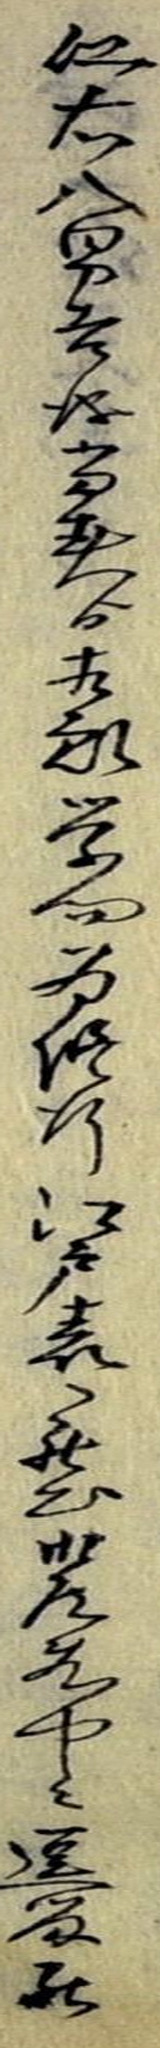但右八男吉儀当春ゟ相願学問為修行江戸表へ罷出御屋敷中に逗留罷在候
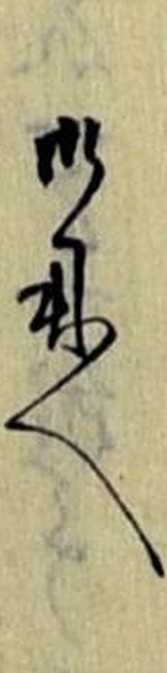御用人
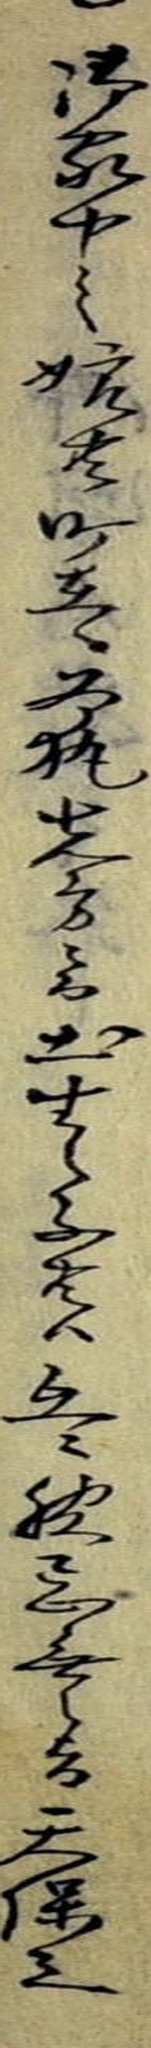○御家中之娵共町在へ為執先方に而出生之子共は互に服忌無之旨天保三
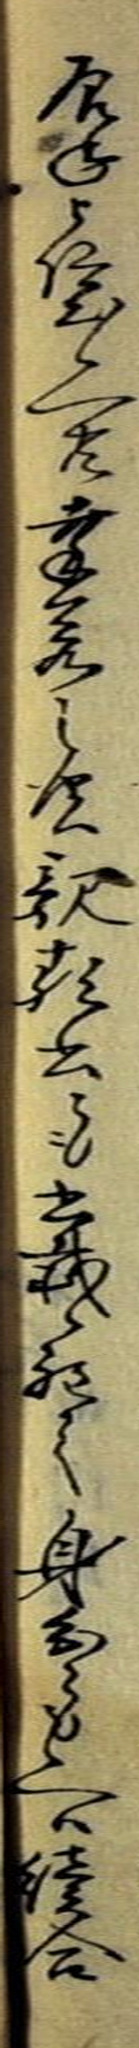辰年被仰出候へ共年若之儀は親類書にも書載候程之身分に候へは続合い
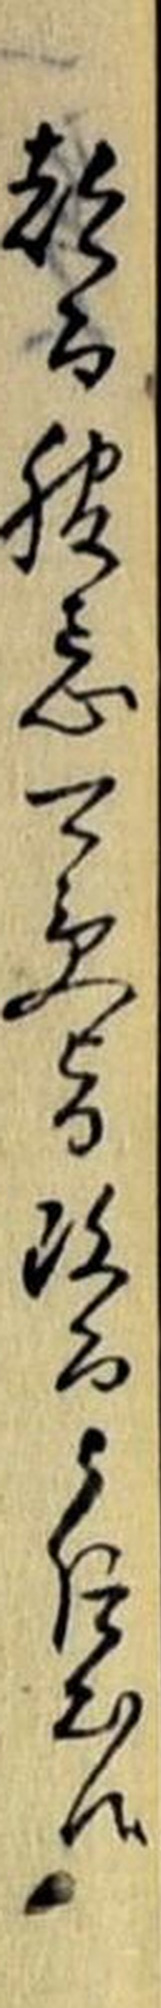都而服忌可受旨改而被仰出候
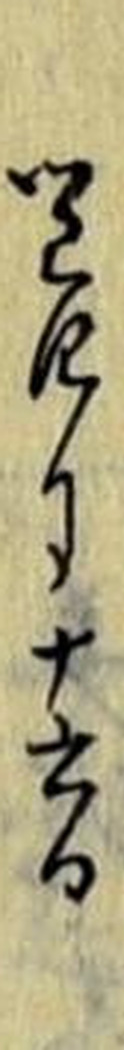四月廿六日
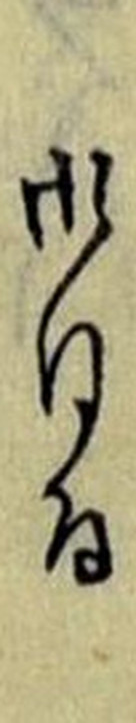御目付
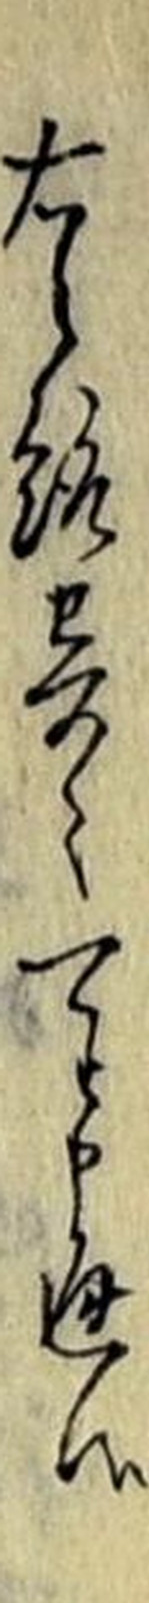右之趣寄々可被申通候
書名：命令之部 六
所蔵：福井県文書館 Fukui Prefectural Archives
